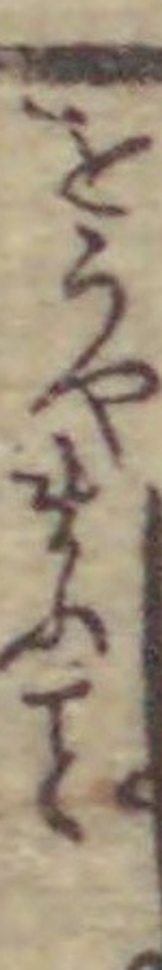をうやまふこと
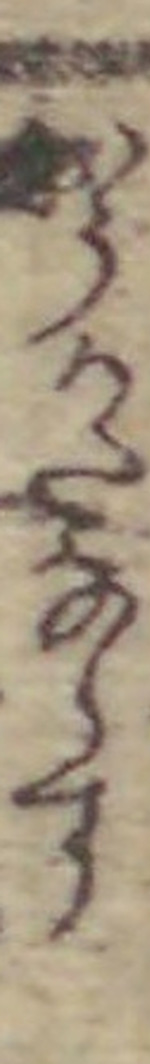おうかたならす
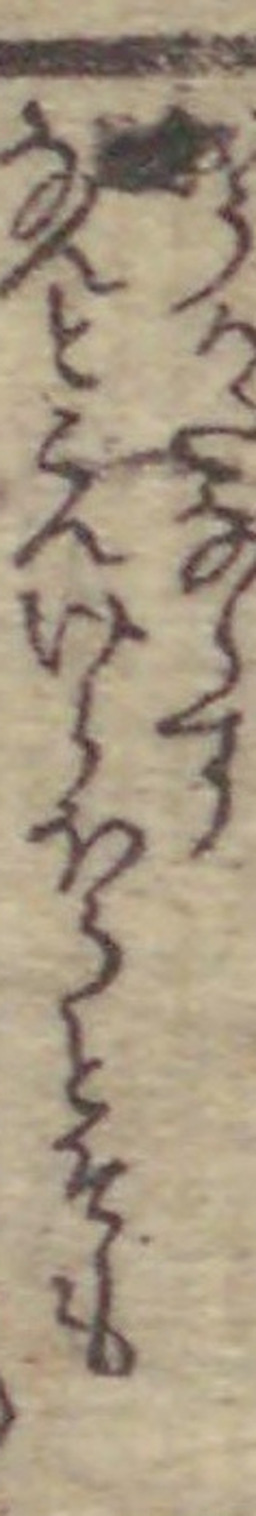なんとこんけらほうとそも
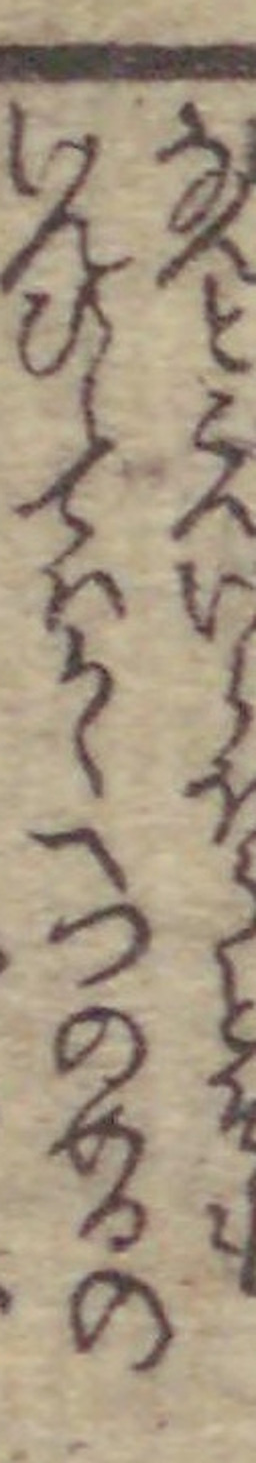けんひしてはかくへつのめるの
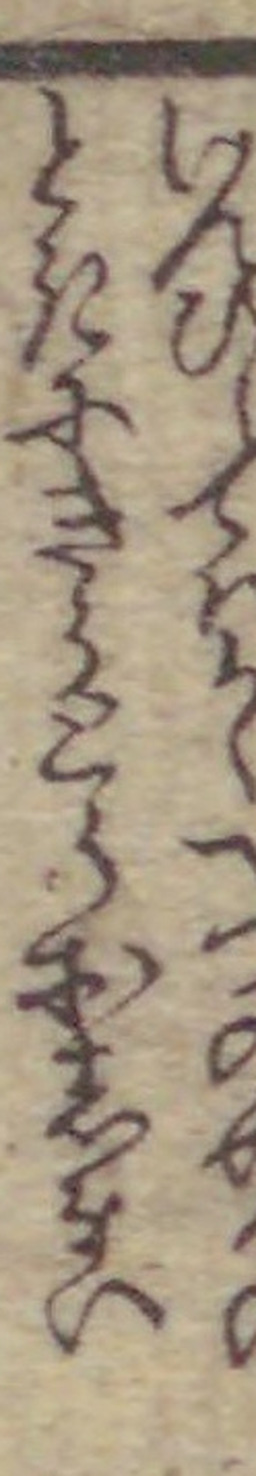ときにきうとうおしまい
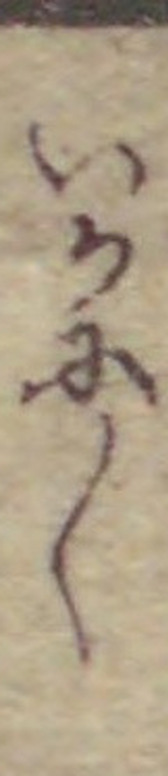いかに〳〵

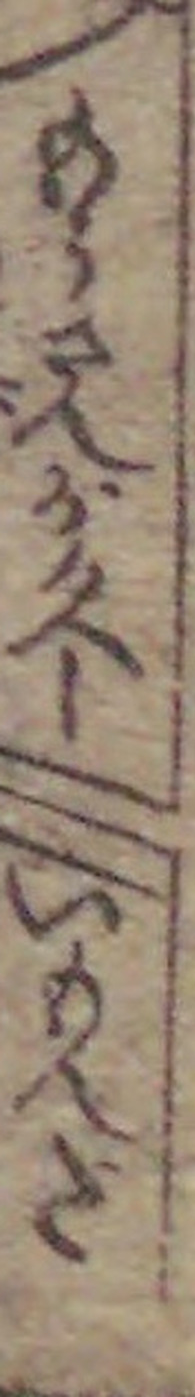もうさんが久しいもんだ
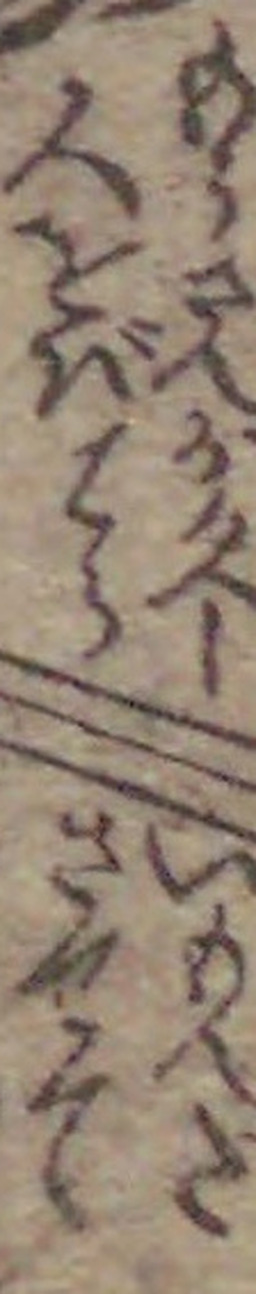人をばてうさせて
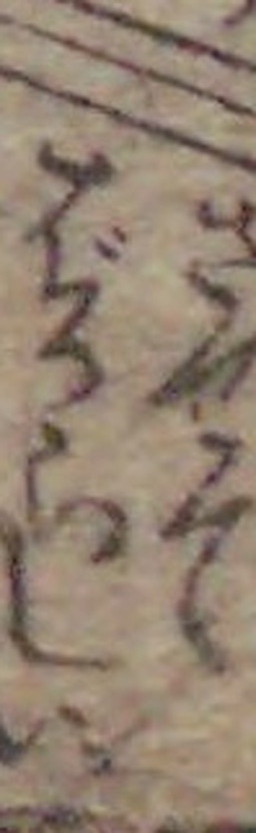ばからしい
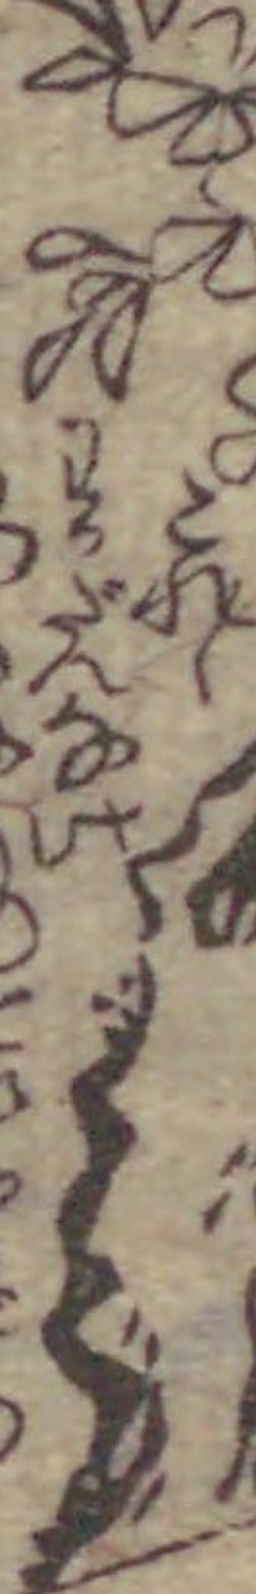わかだんな此
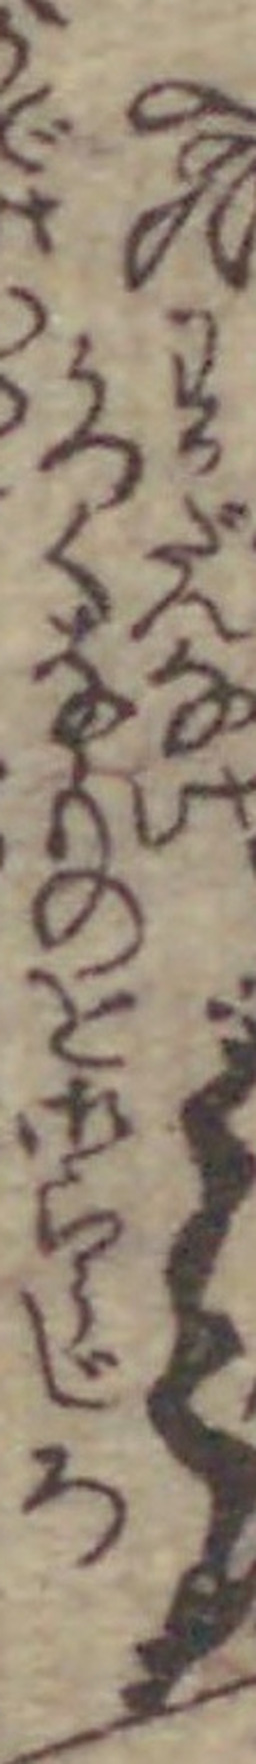うつくなものを御らうじろ
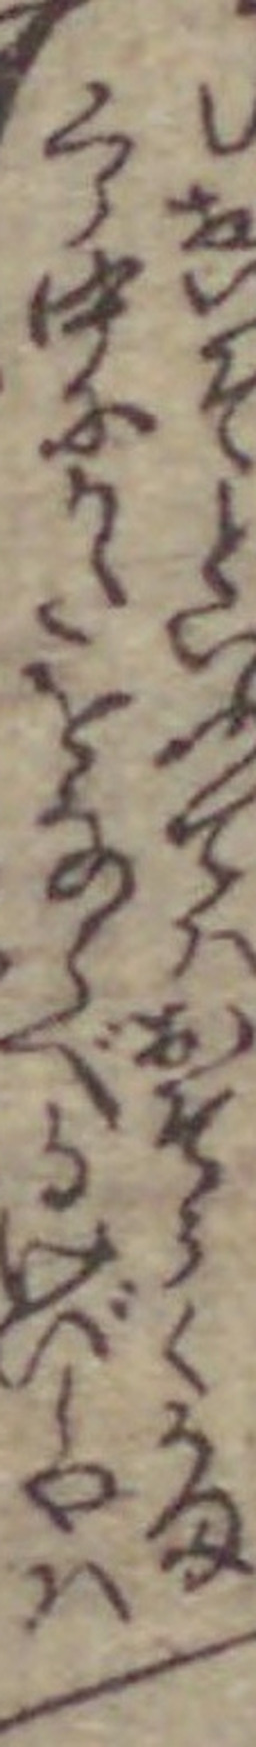くら中にかたをならべるげいしやは
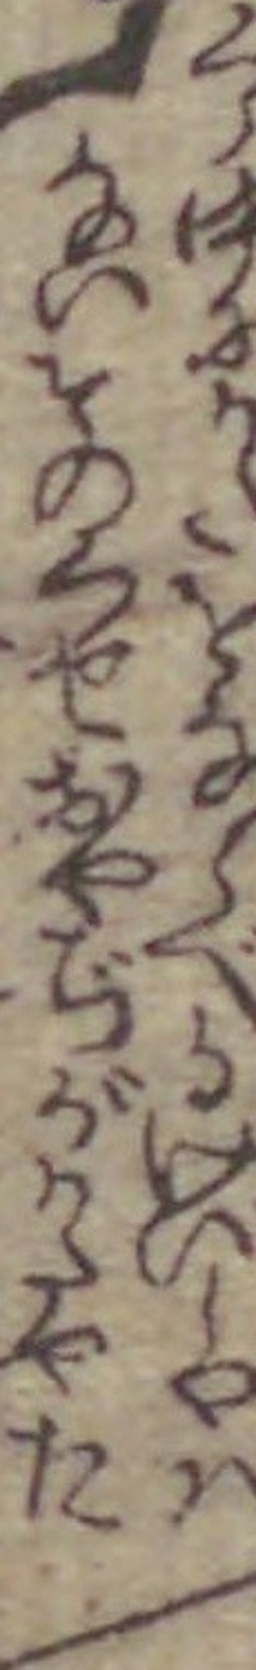ないそのくせおやぢがけたやた
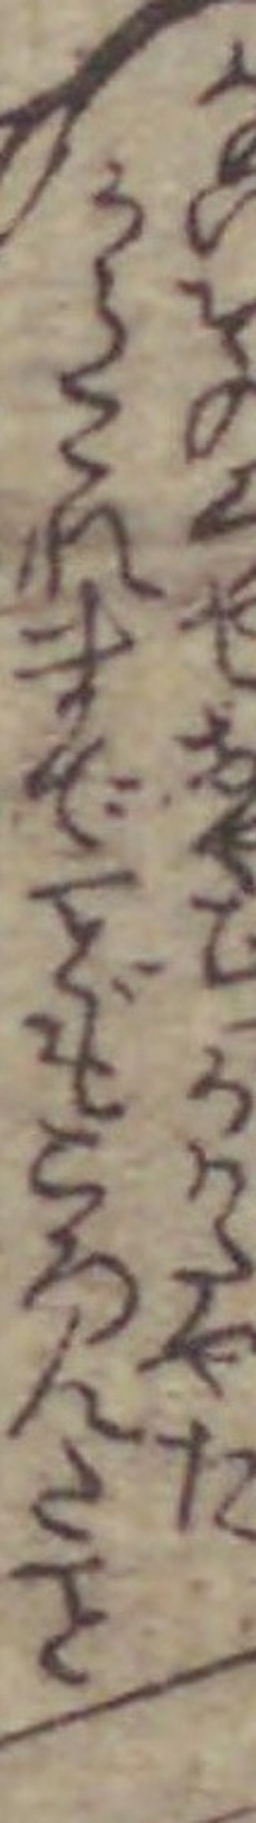からこれまで一どもころんたこと
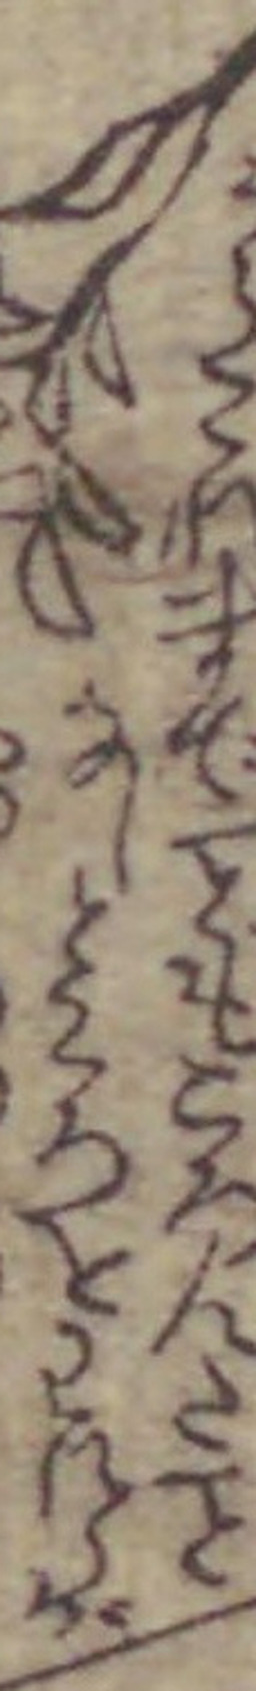なしところをわれらが
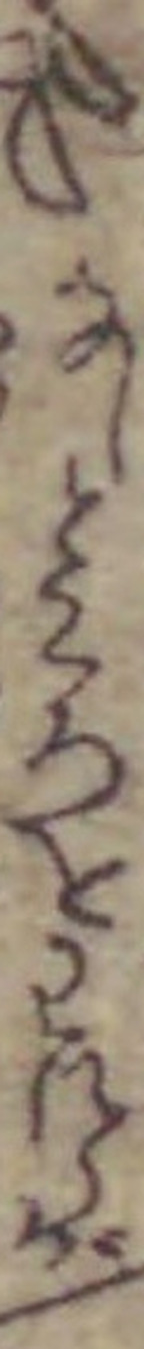なしところをわれらが
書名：止而道致虚録 3巻
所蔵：国立国会図書館 National Diet Library, JAPAN
